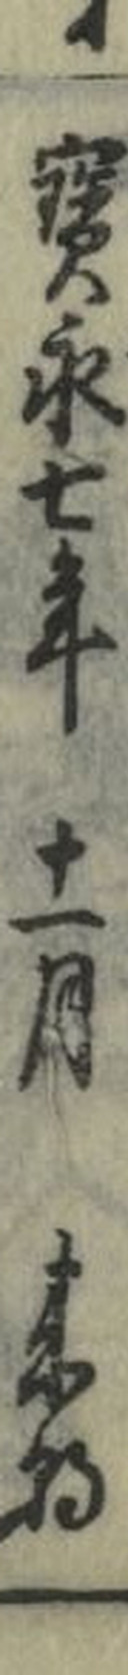寶永七年十一月来朝
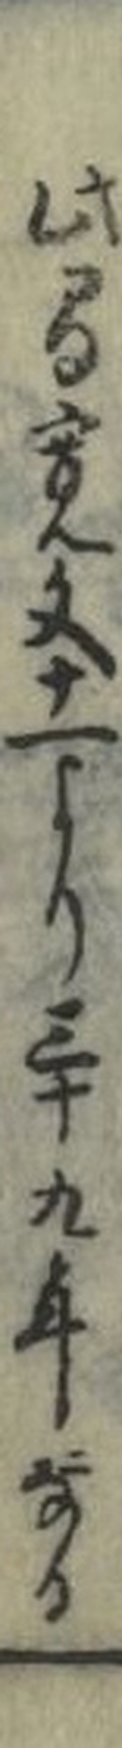此間寛文十一より三十九年になる
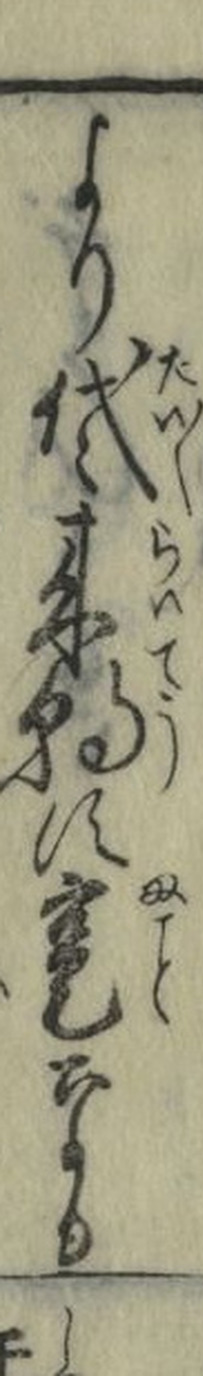より代々来朝す実なる
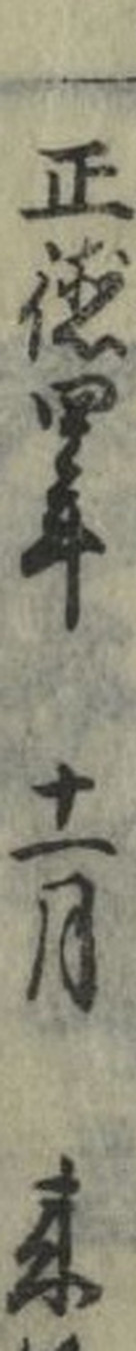正徳四年十一月来朝
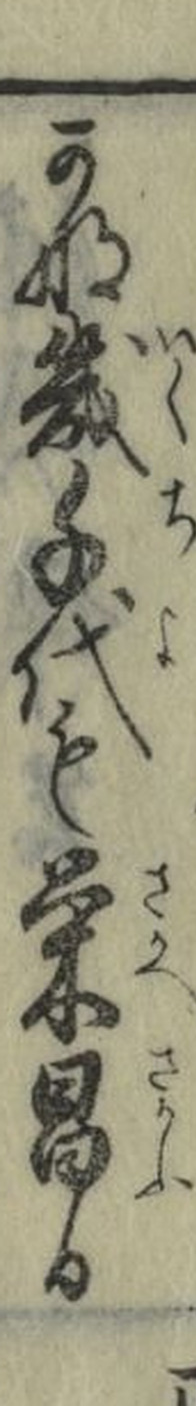かな幾千代を栄昌る
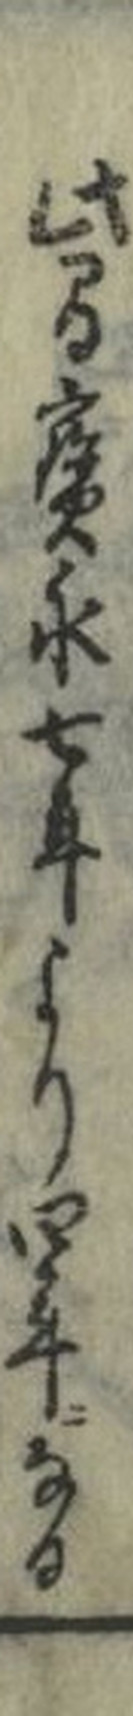此間寶永七年より四年になる
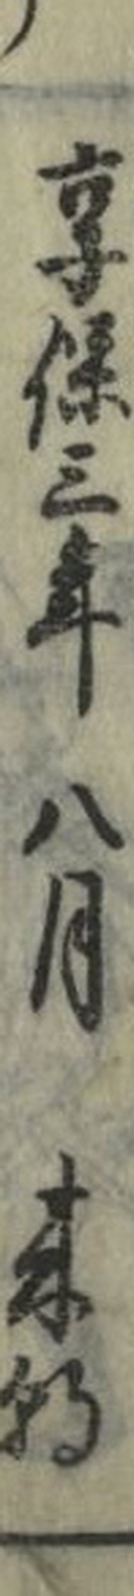享保三年八月来朝
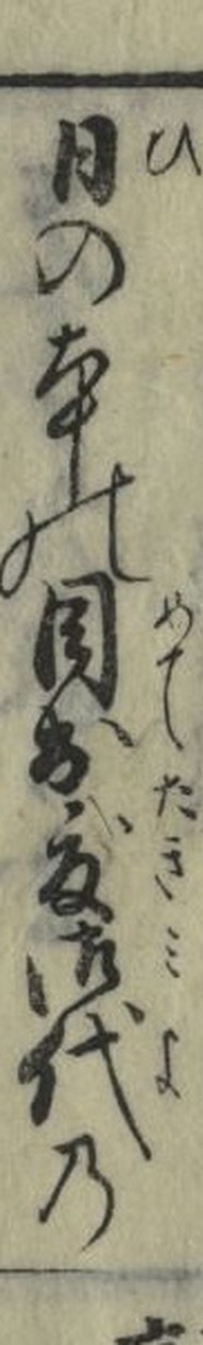日の本の目出度御代の
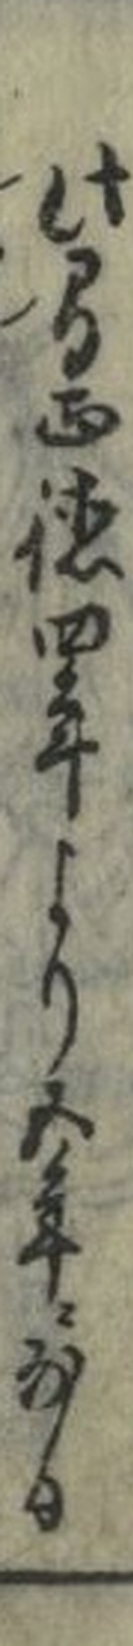此間正徳五年より五年になる
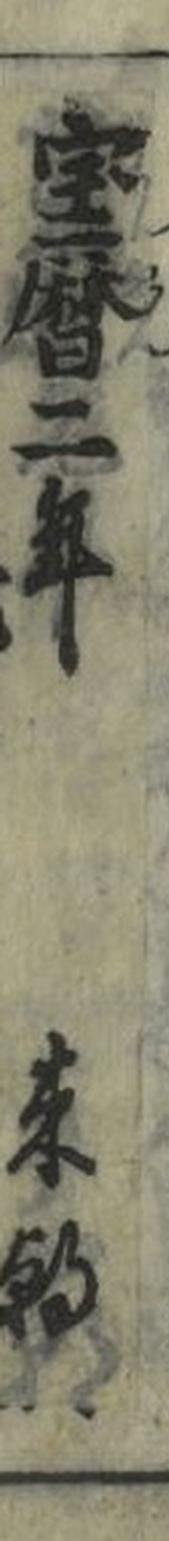宝暦二年来朝
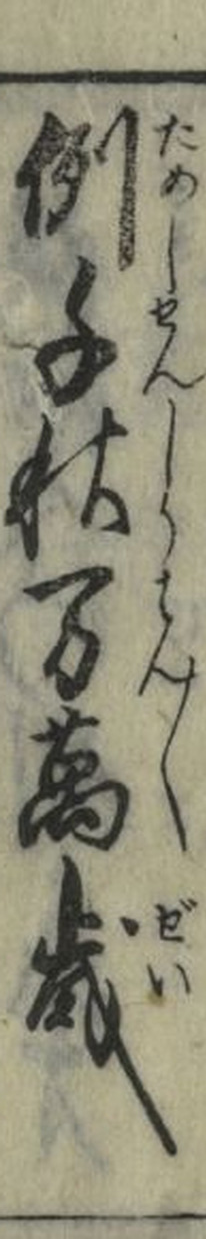例千秋万萬歳
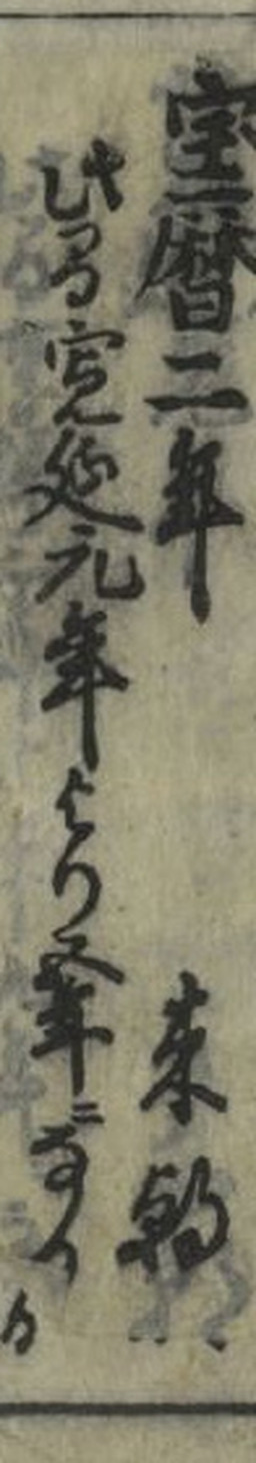此間寛延元年より五年になる

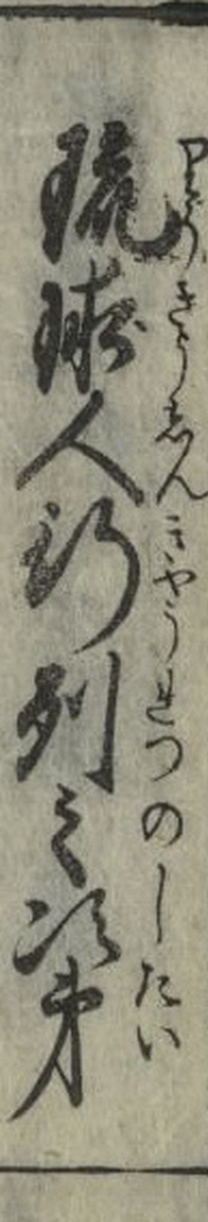琉球人行列之次第
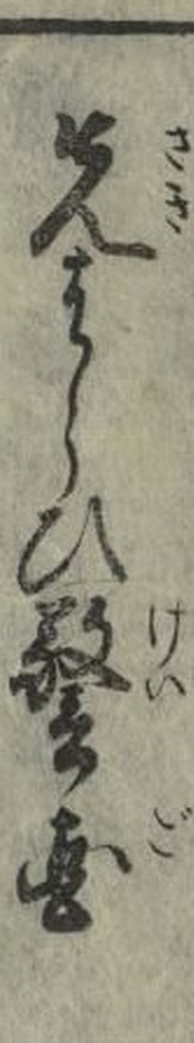先はらひ警固
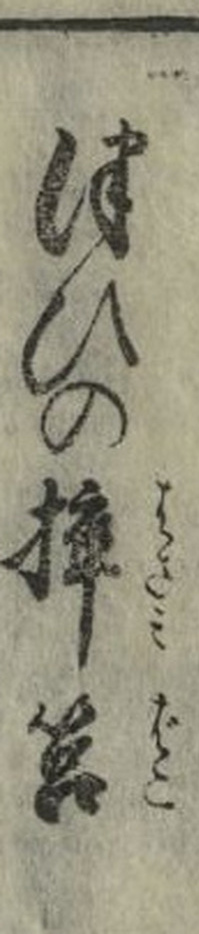つひの挟箱
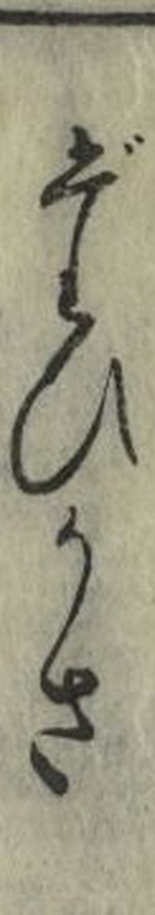だひかさ
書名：琉球人大行列記
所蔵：University of the Ryukyus Library
